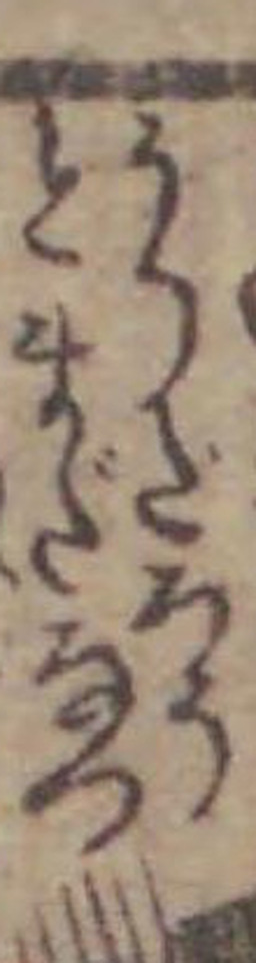とまだなつ
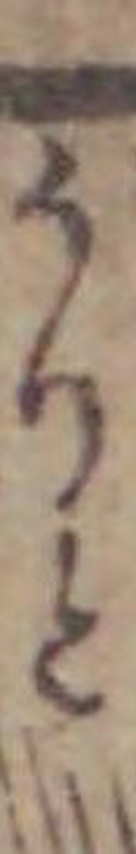うりと
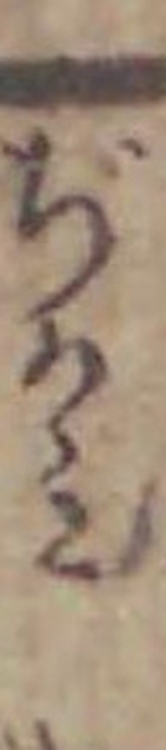ぢかみ
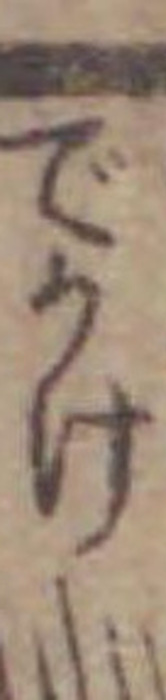でかけ
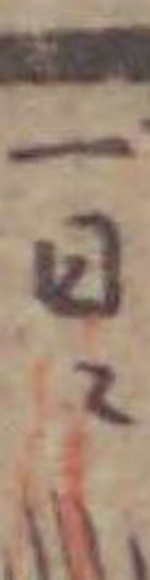一日に
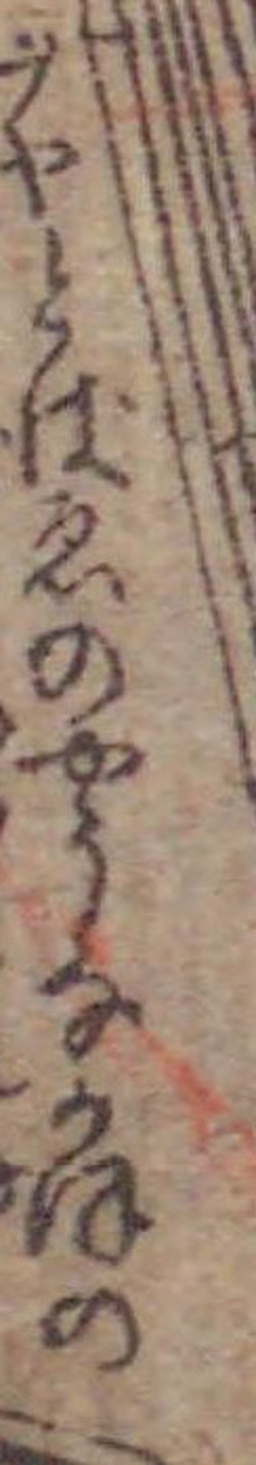ヲヤとはゑのやうなかほの
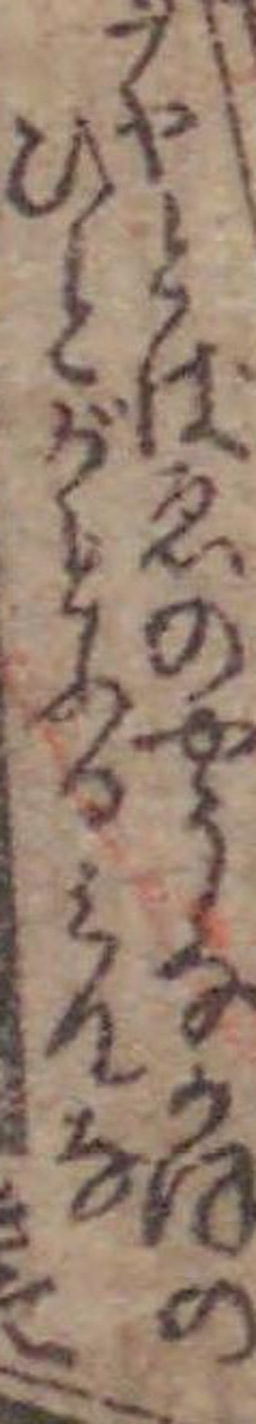ひとがとふるみんなきて
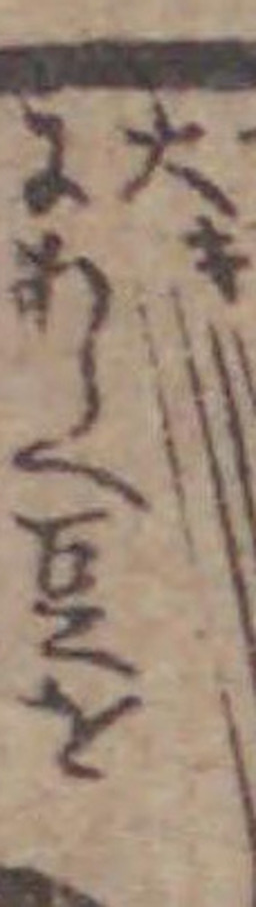にあしへ豆を
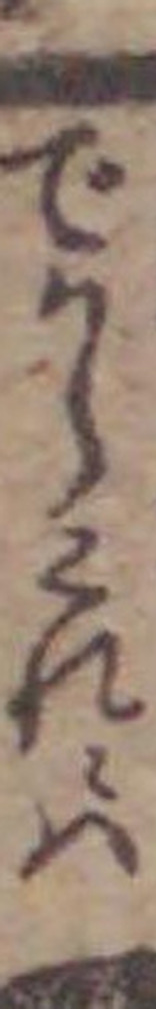でかしこれには
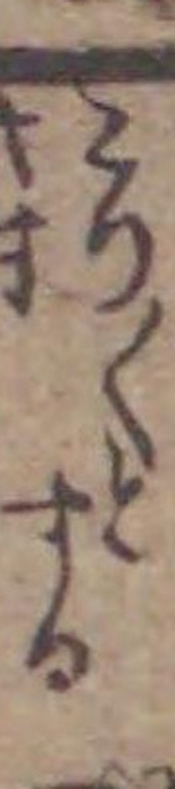こり〳〵とする
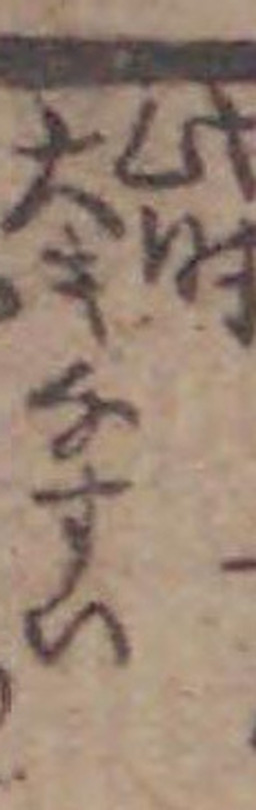大きなすい
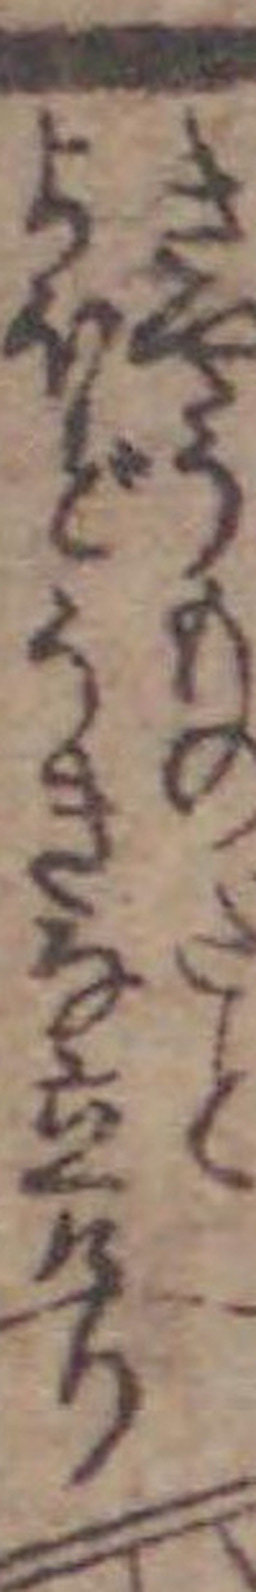よほどうきな立けり

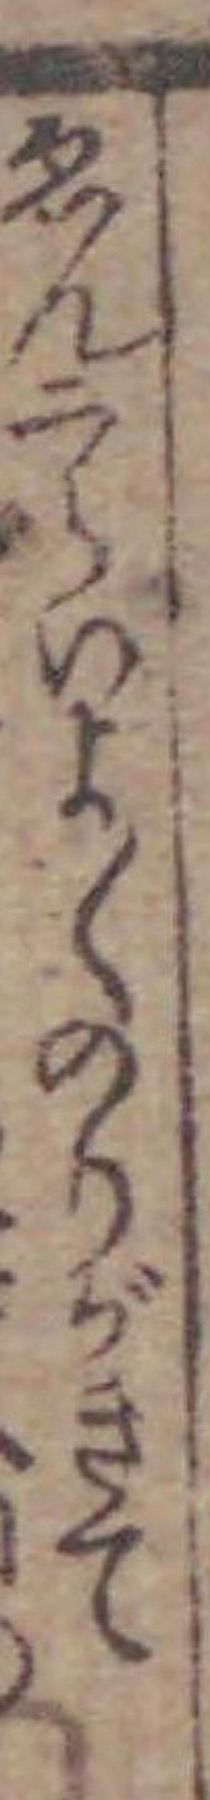ゑん二郎いよ〳〵のりがきて
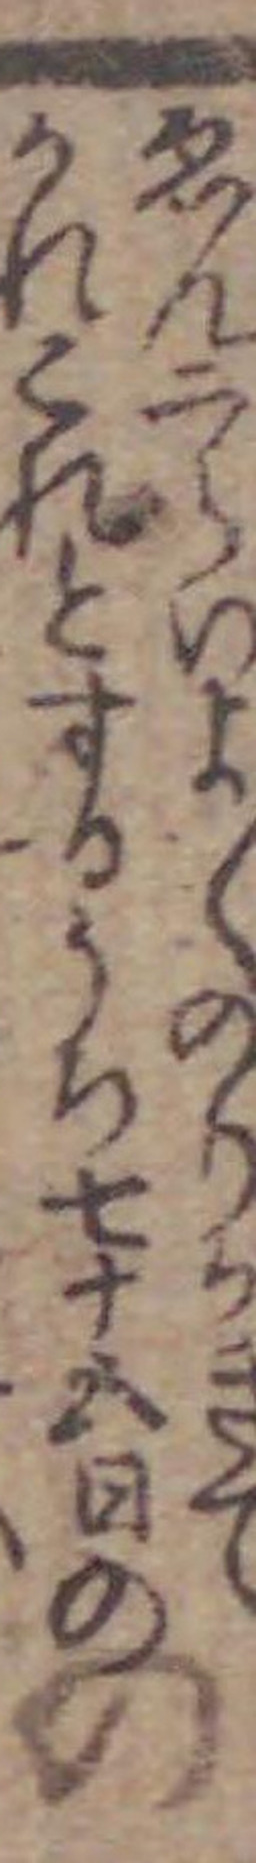かれこれとするうち七十五日の
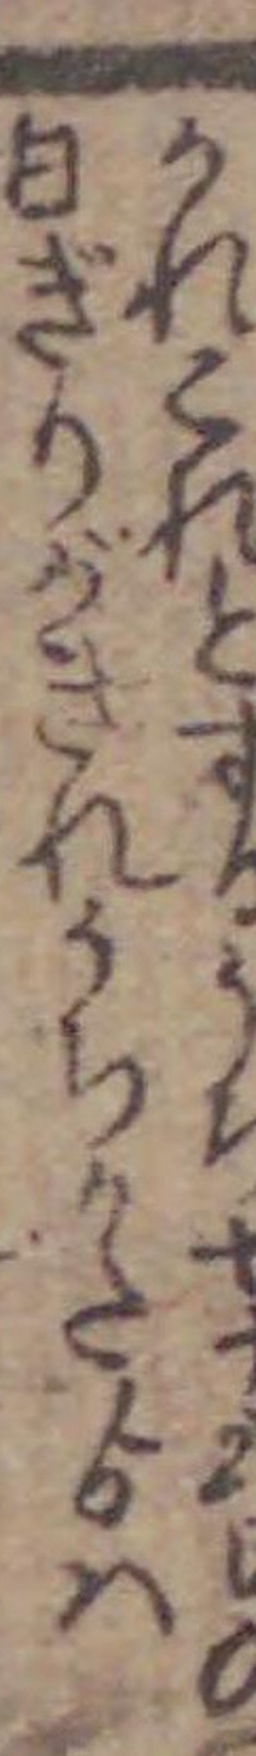日ぎりがきれうちかたよりは
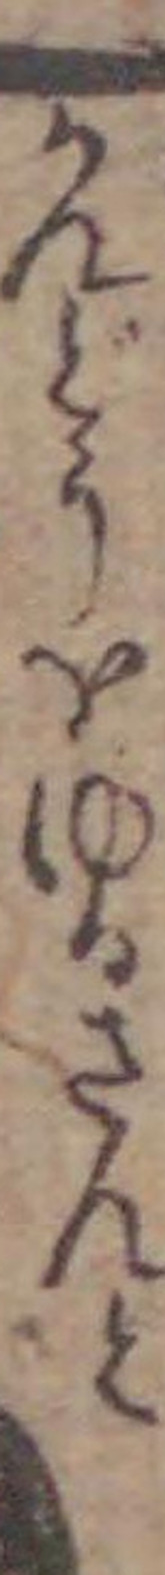かんどうをゆるさんと
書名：江戸生艶気樺焼 : 3巻
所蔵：国立国会図書館 National Diet Library, JAPAN
